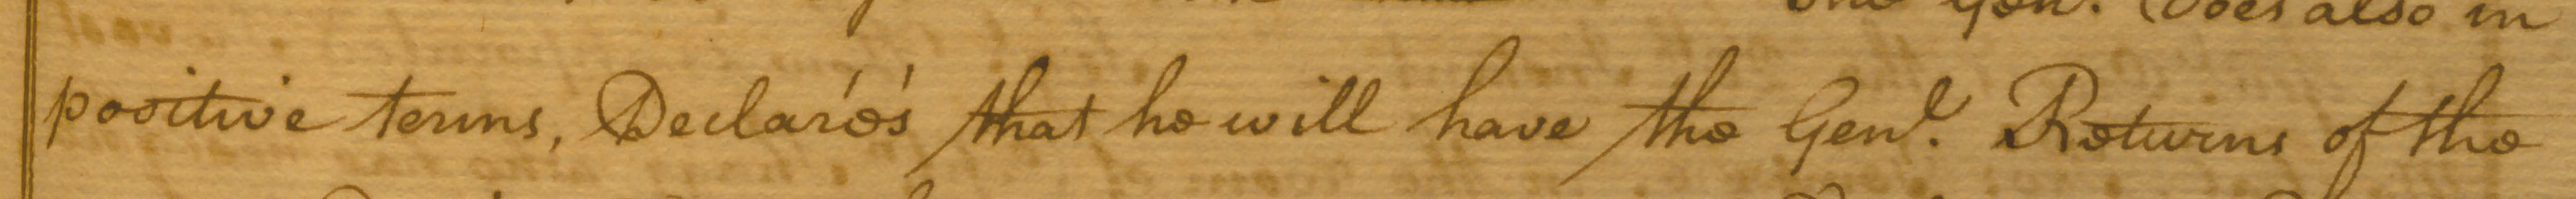positive terms. Declares that he will have the Gen^l. Returns of the
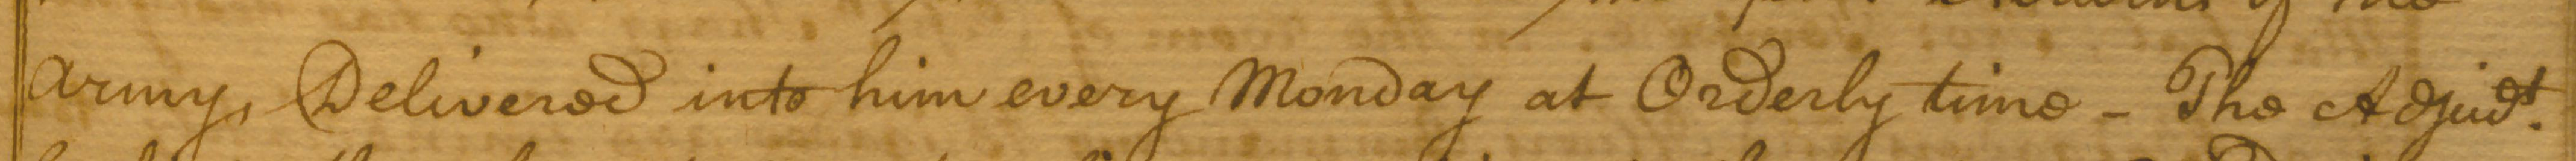army Delivered into him every Monday at Orderly time- The Adjud^t.
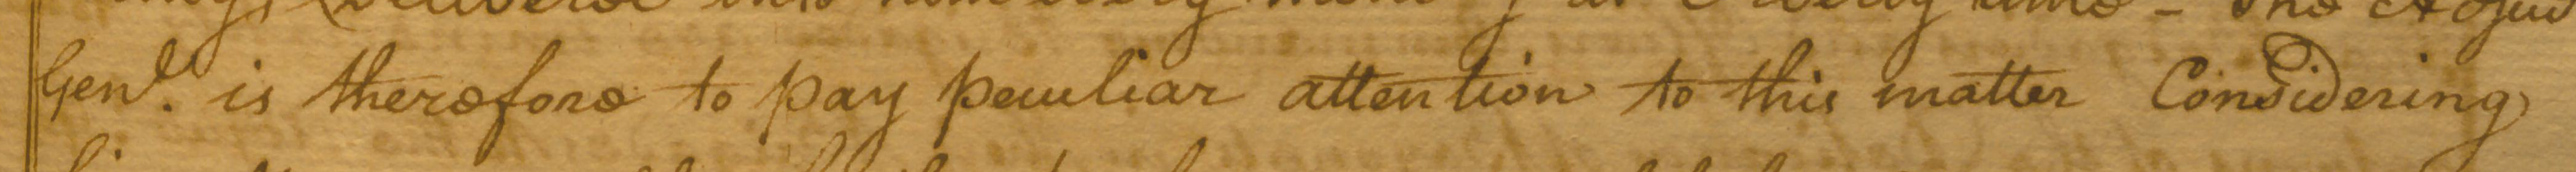Gen^l. is therefore to pay peculiar attention to this matter Considering
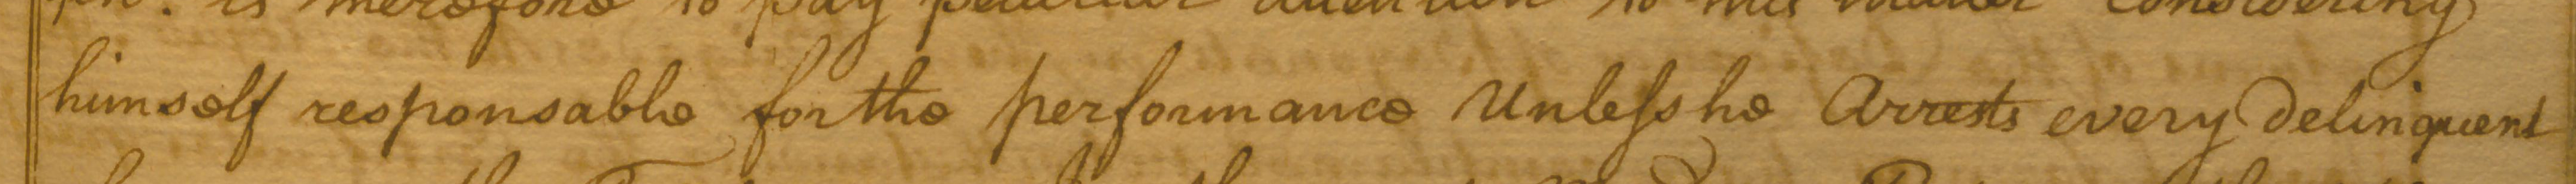himself responsable for the performance unless he Arrests every delinquent
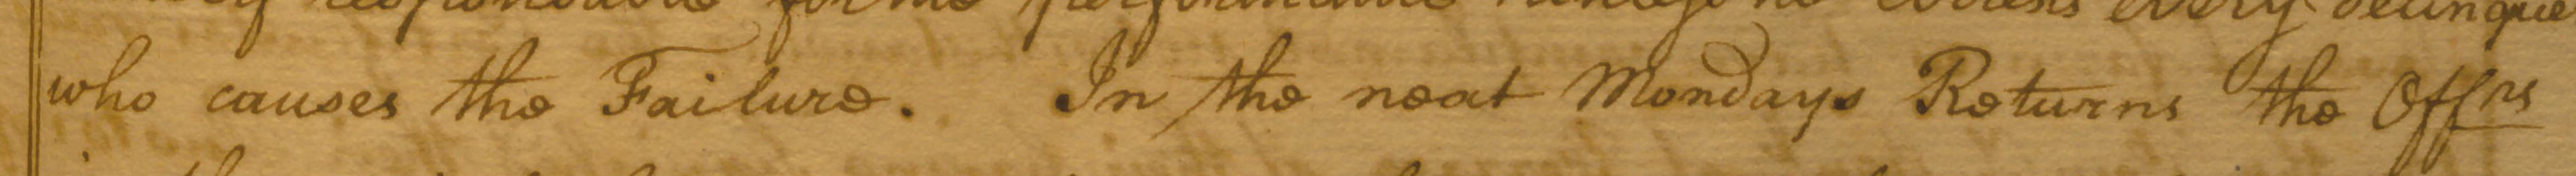who causes the Failure. In the next Mondays Returns the Off^rs
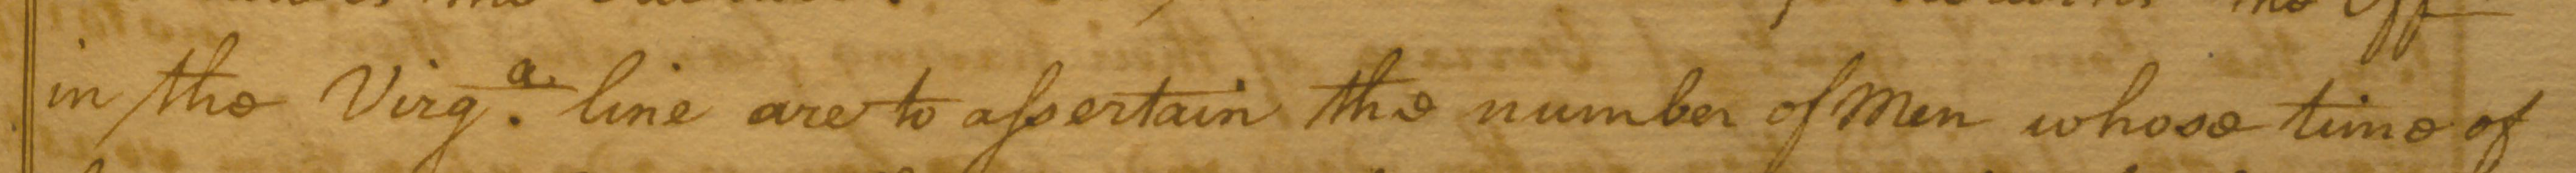in the Virg^a. line are to assertain the number of Men whose time of
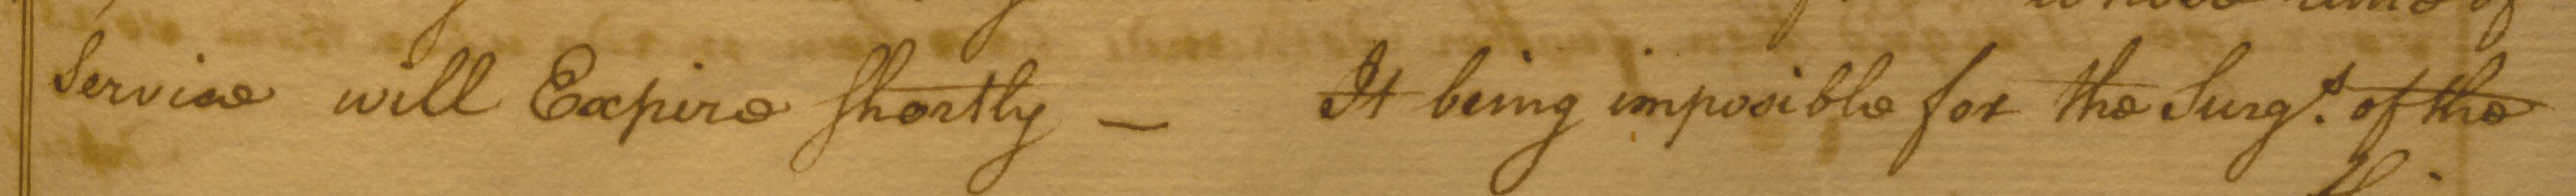Service will Expire shortly- It being impossible for the Surg^s. of the
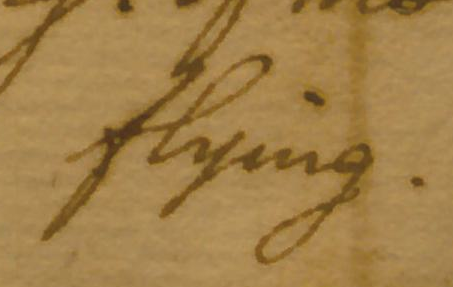flying
